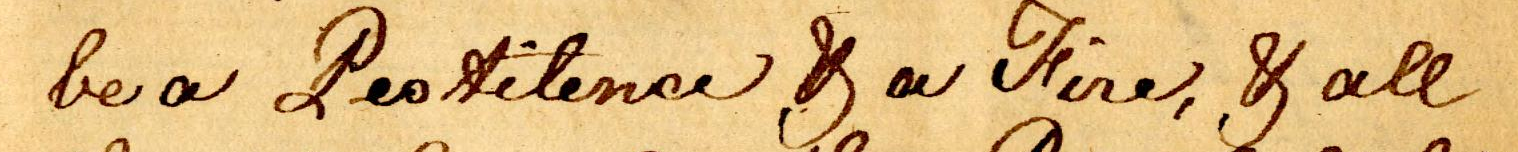be a Pestilence & a Fire, & all
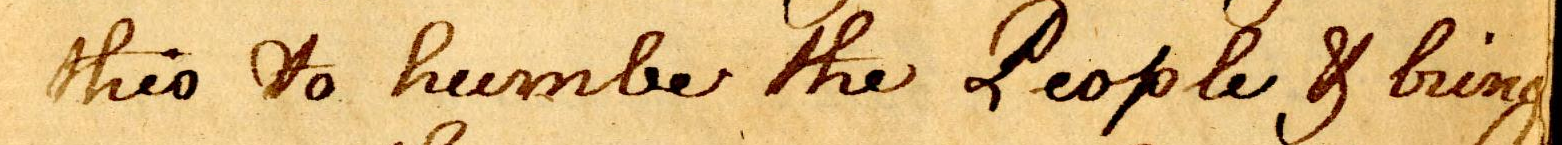this to humbe the People & bring
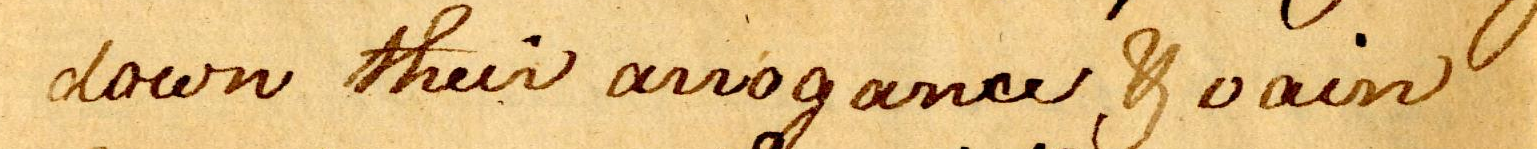down their arrogance & vain
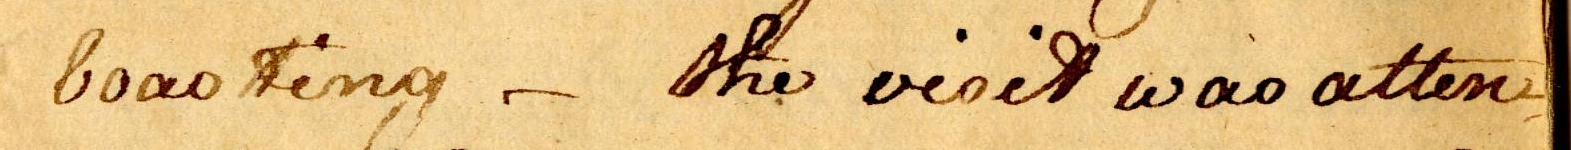boasting- the visit was atten
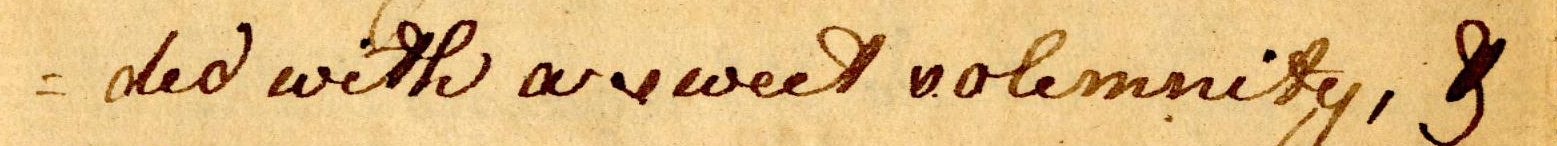-ded with a sweet solemnity, &
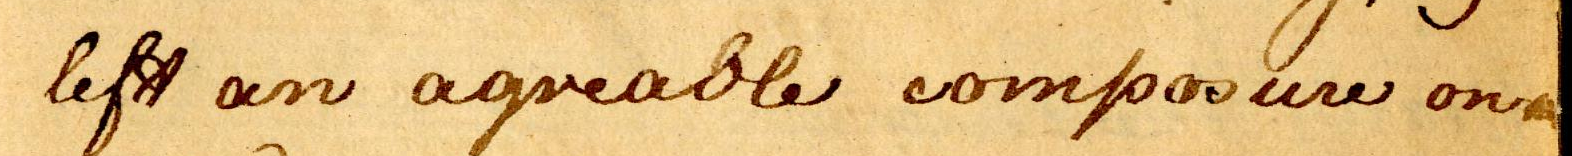left an agreable composure on
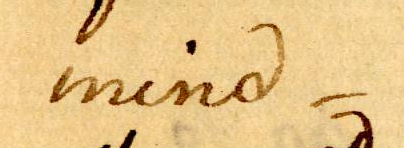mind-
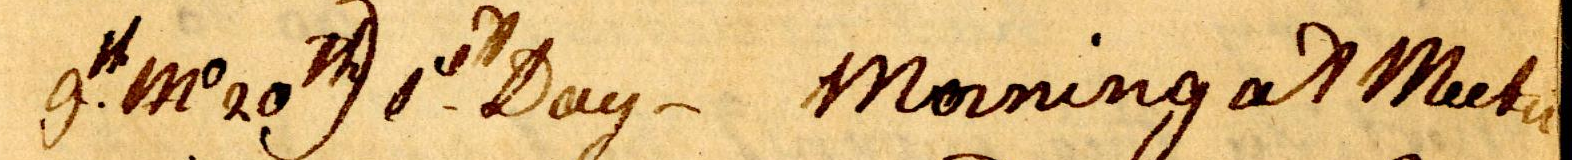9^th M^o 20^th ) 1^st Day- Morning at Meetin
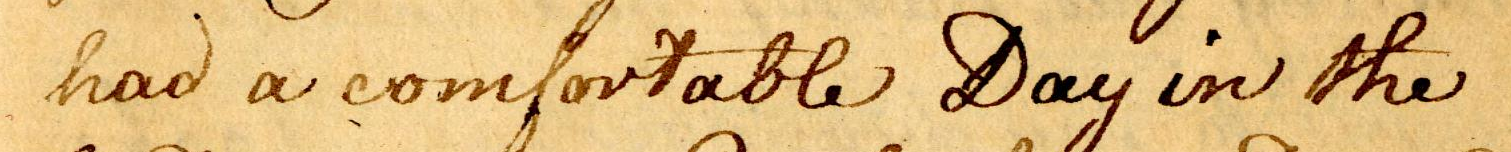had a comfortable Day in the
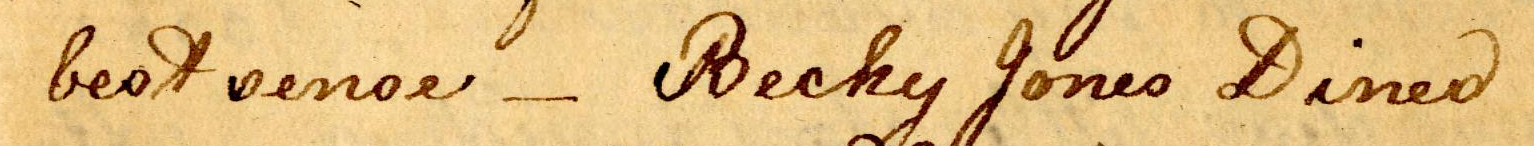best sense- Becky Jones Dined
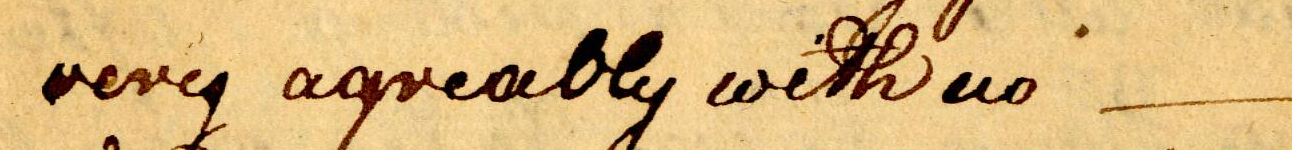very agreably with us-
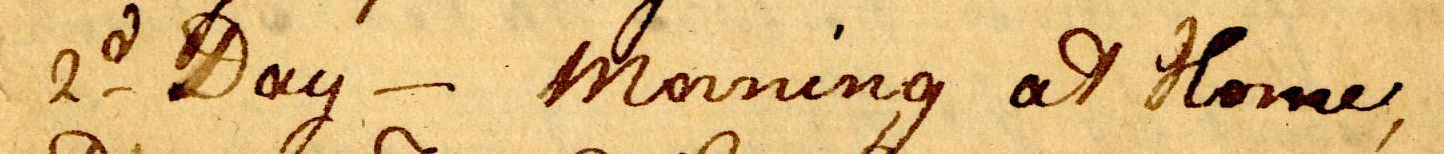2^d Day- Morning at Home,
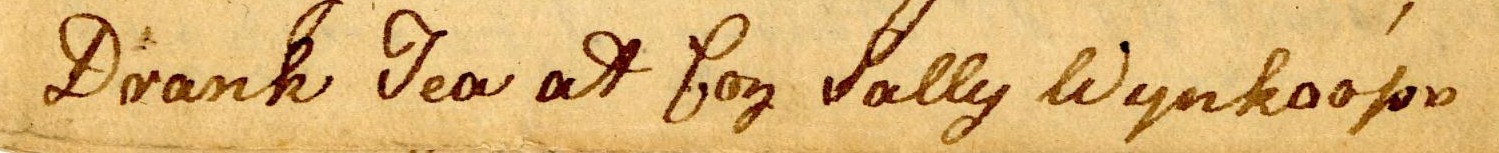Drank Tea at Coz Sally Wynkoops
